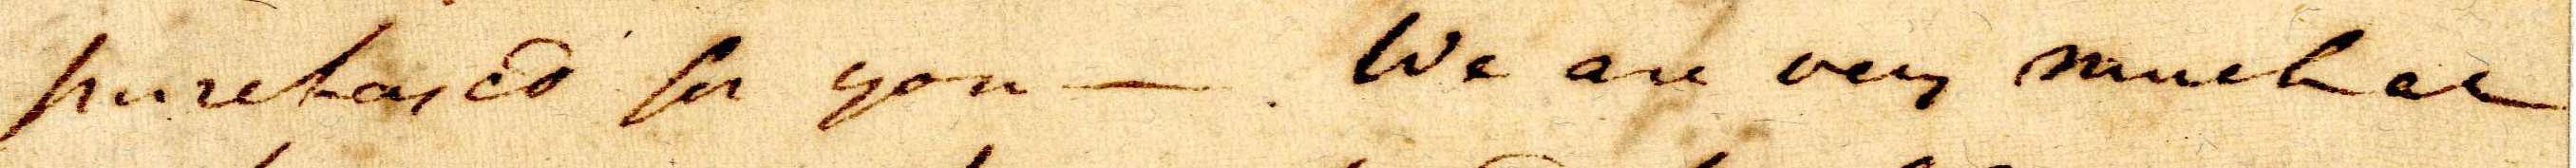purchased for you. we are very much at
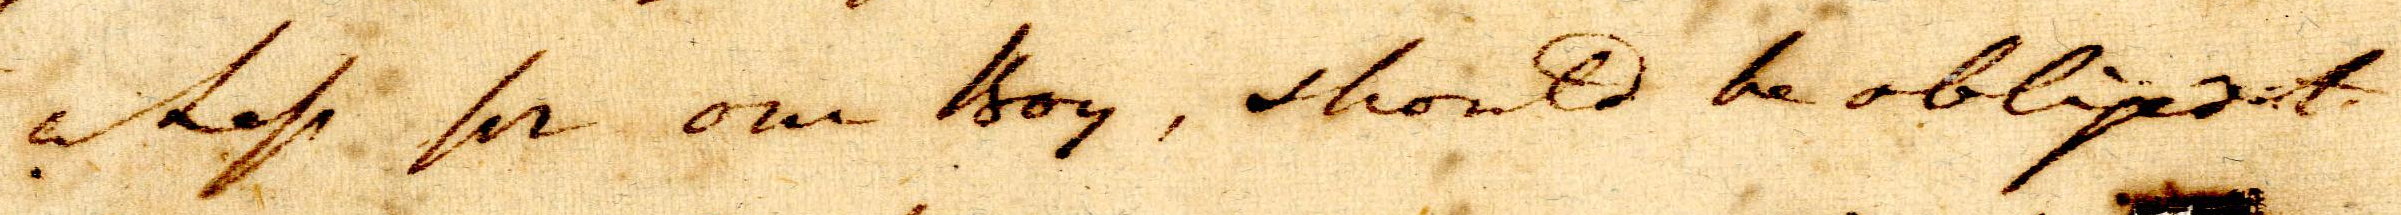a Loss for our Boy, should be obliged it
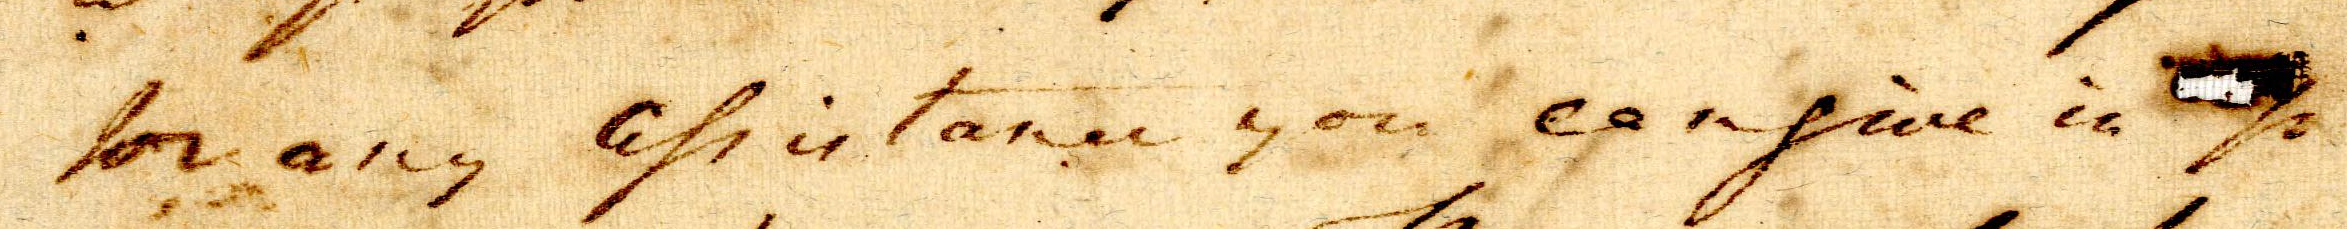for any assistance you can give in [__]
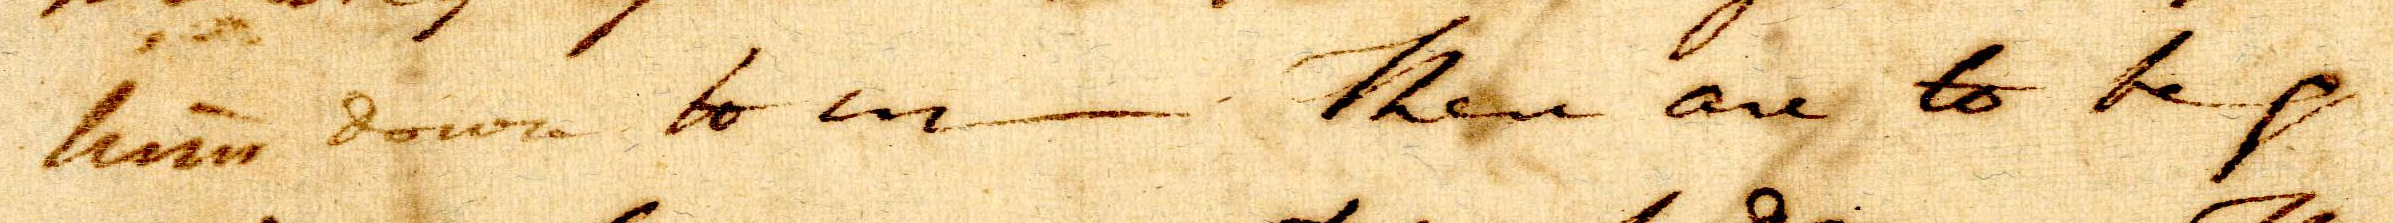him down to us. There are to be [_]
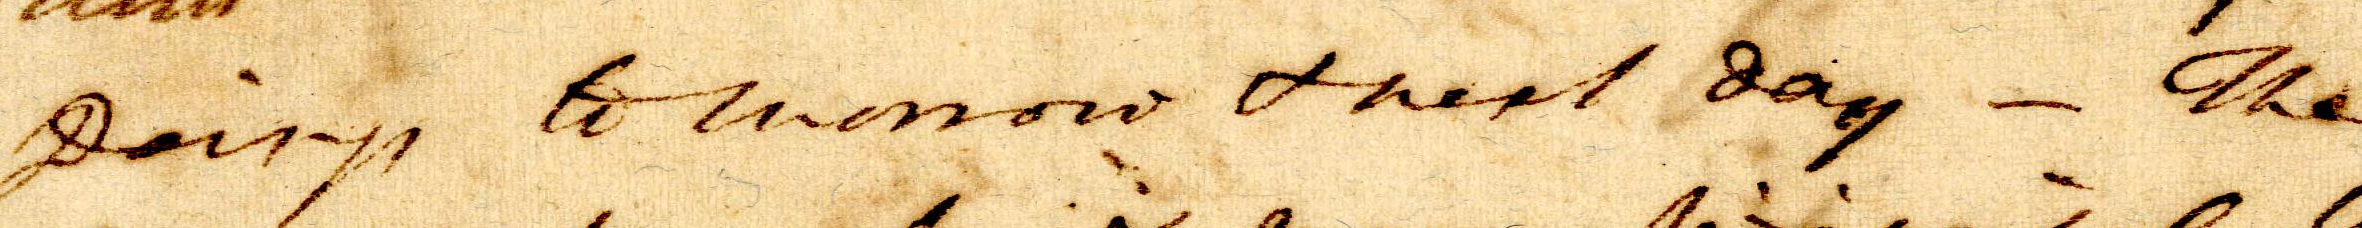Doings tomorrow & next day. The
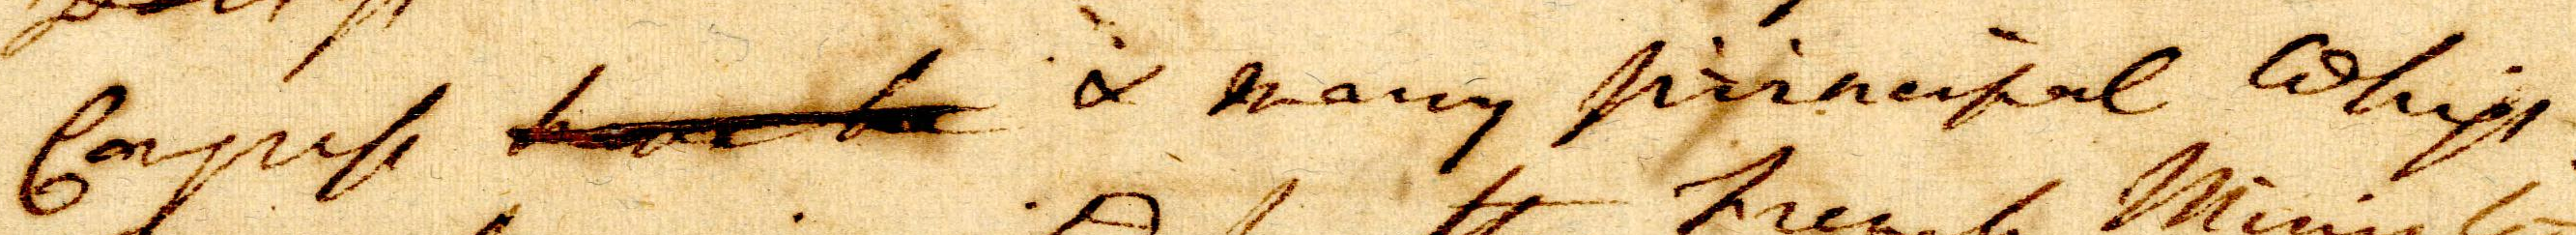Congress have be & many principal Whigs
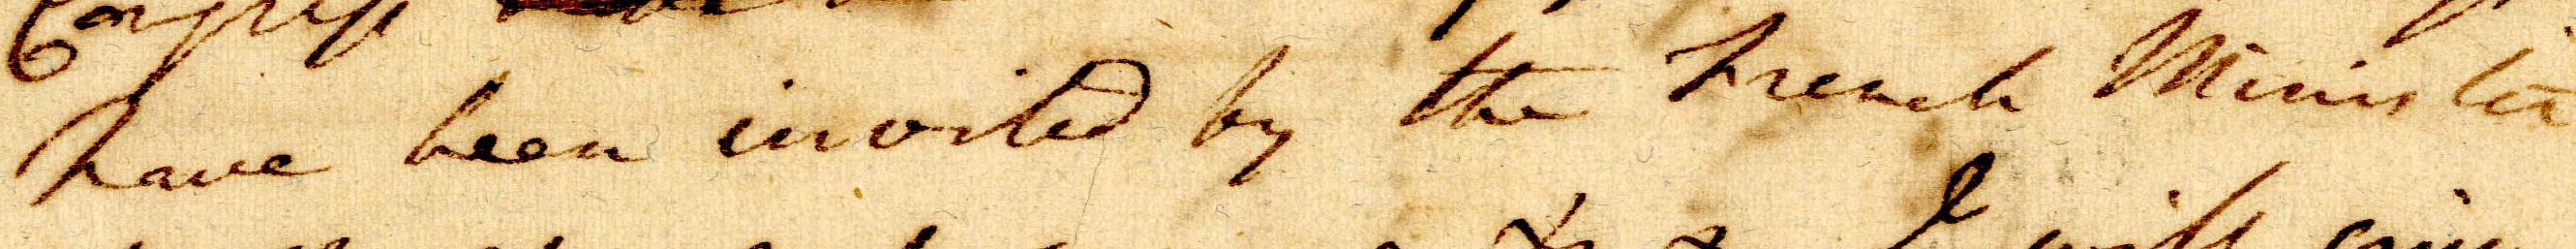have been invited by the French Minister
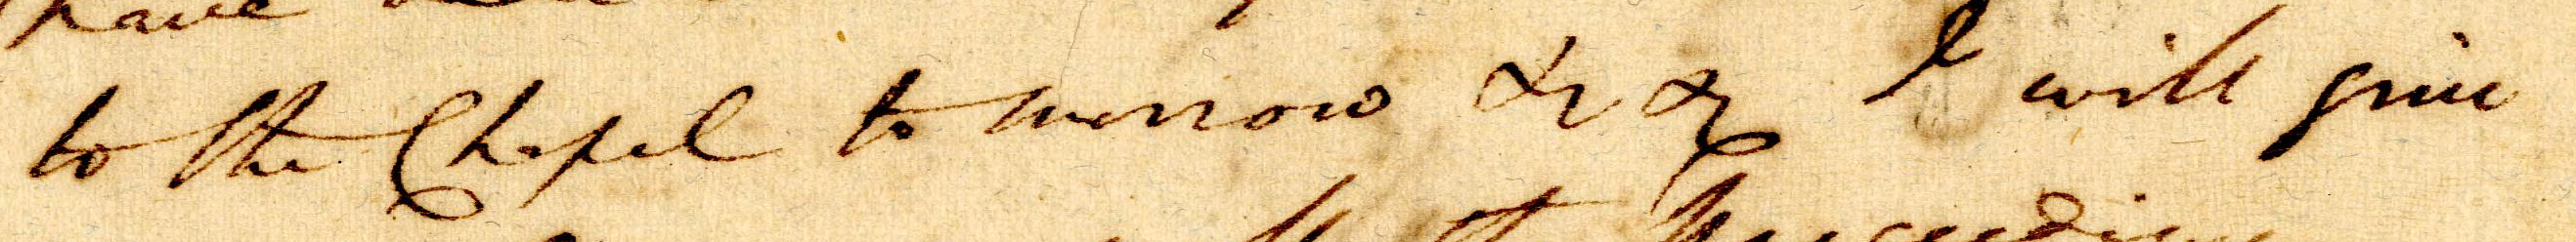to the Chapel tomorrow & [_] I will give
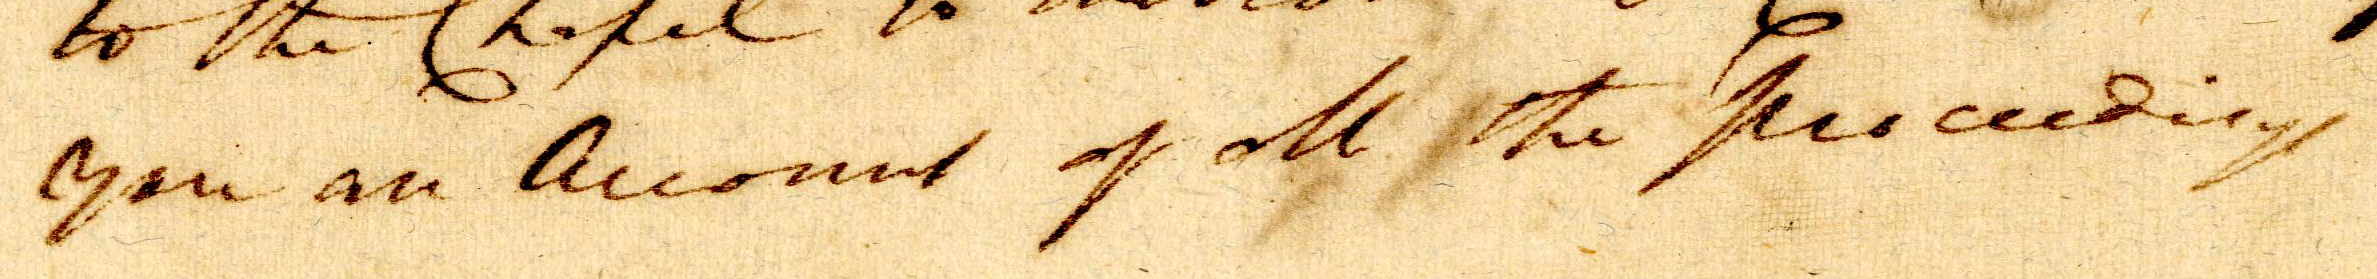you an Account of all the proceedings
